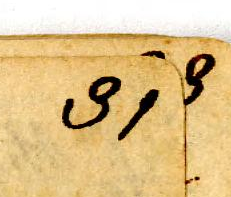31
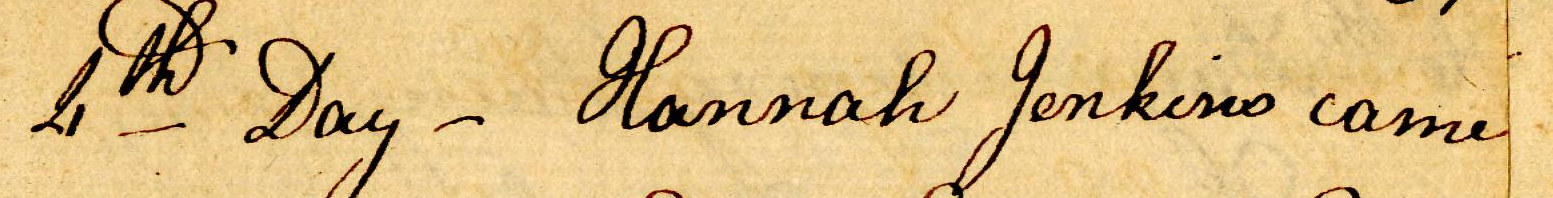4^th Day- Hannah Jenkins came
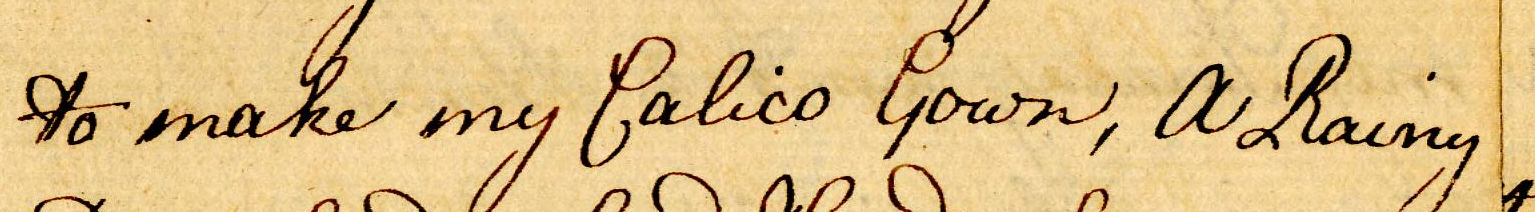to make my Calico Gown, A Rainy
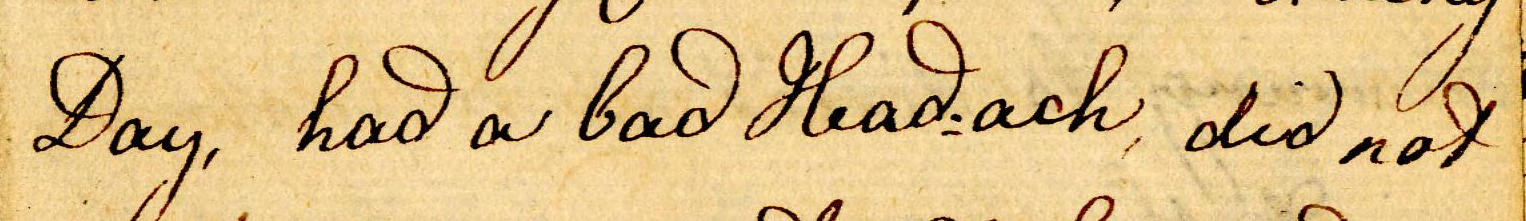Day, had a bad Head-ach, did not
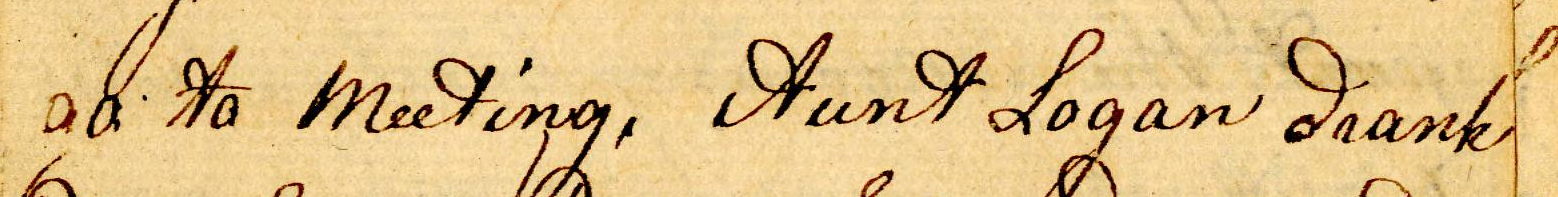go to Meeting, Aunt Logan drank
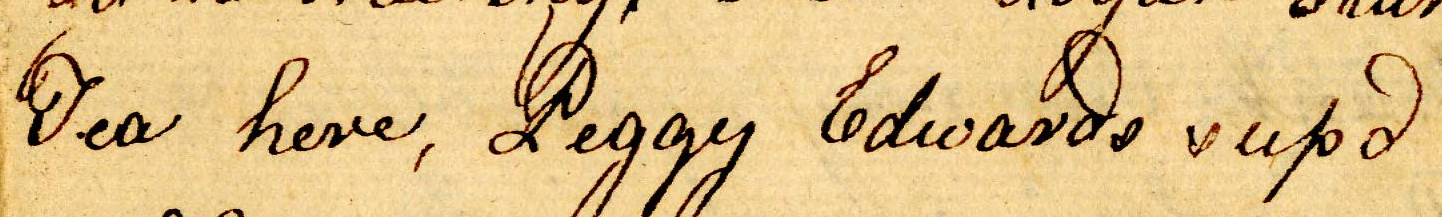Tea here, Peggy Edwards supd
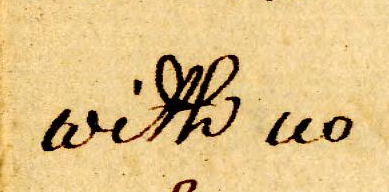with us
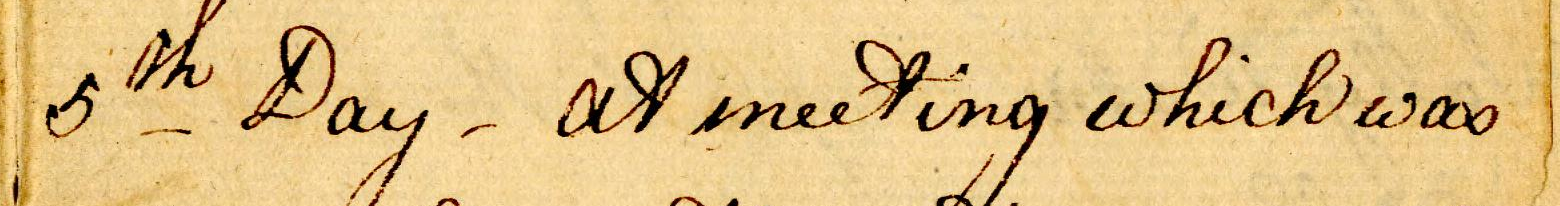5^th Day- at meeting which was
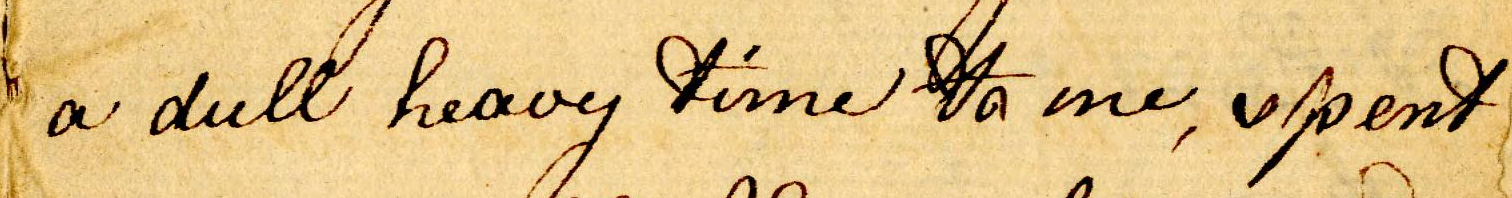a dull heavy time to me, spent
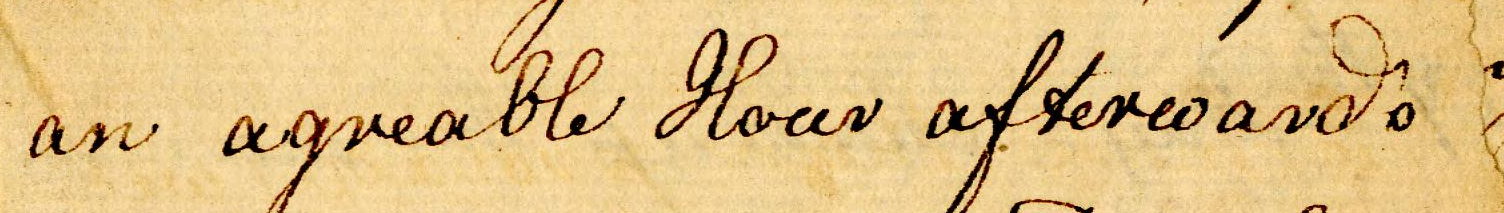an agreable Hour afterwards
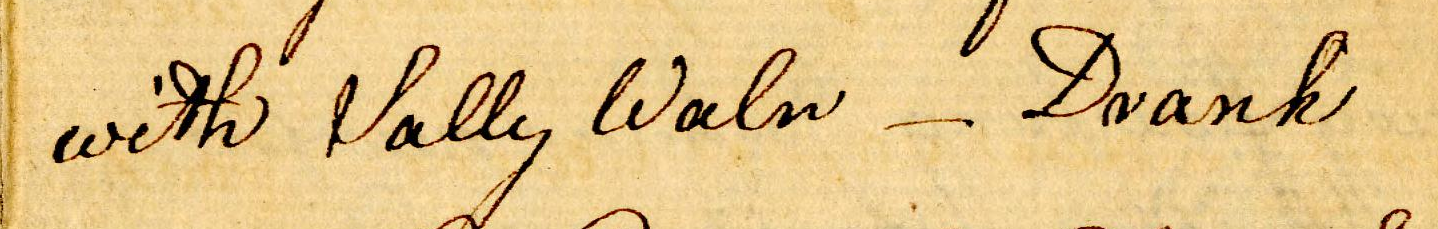with Sally Waln- Drank
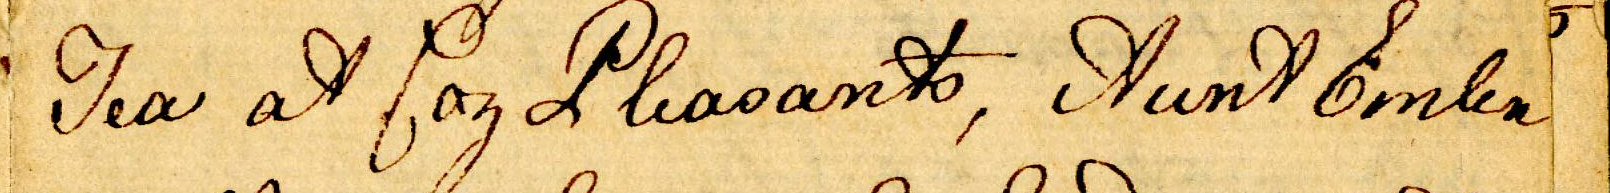Tea at Coz Pleasants, Aunt Emlen
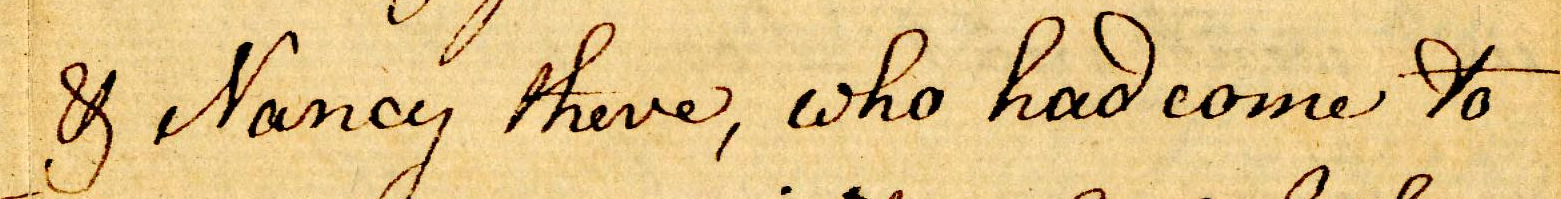& Nancy there, who had come to
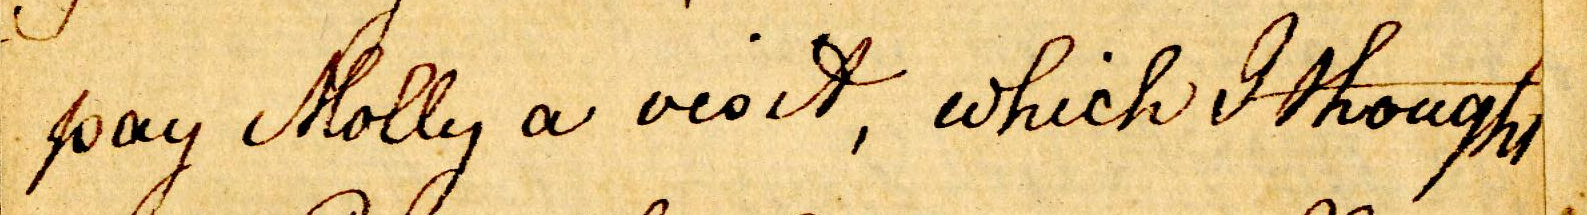pay Molly a visit, which I thought
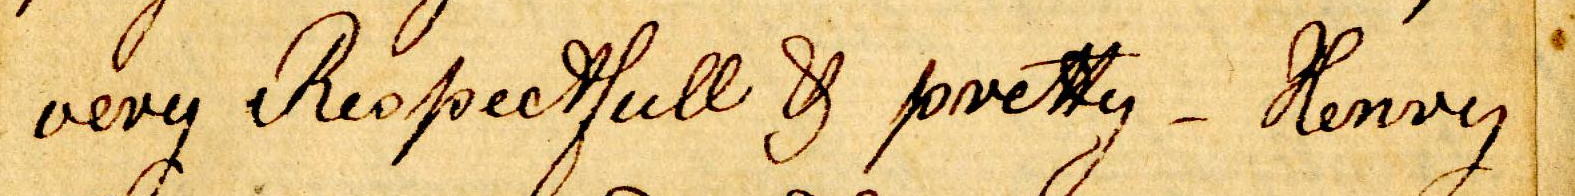very Respectfull & pretty- Henry
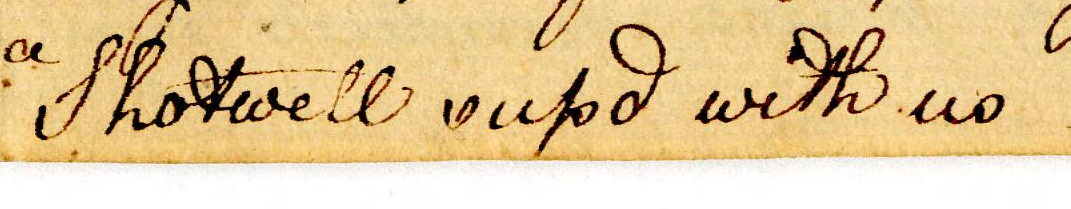Shotwell supd with us
